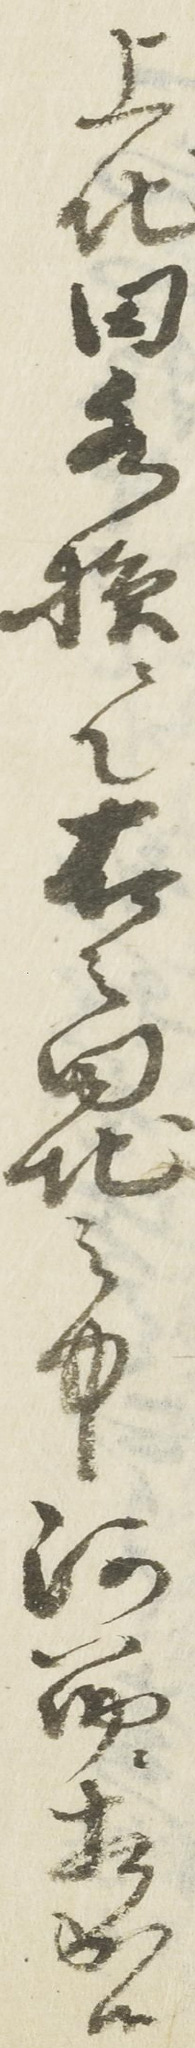上地田水損ニて右之田地之中河筋ニ相成候
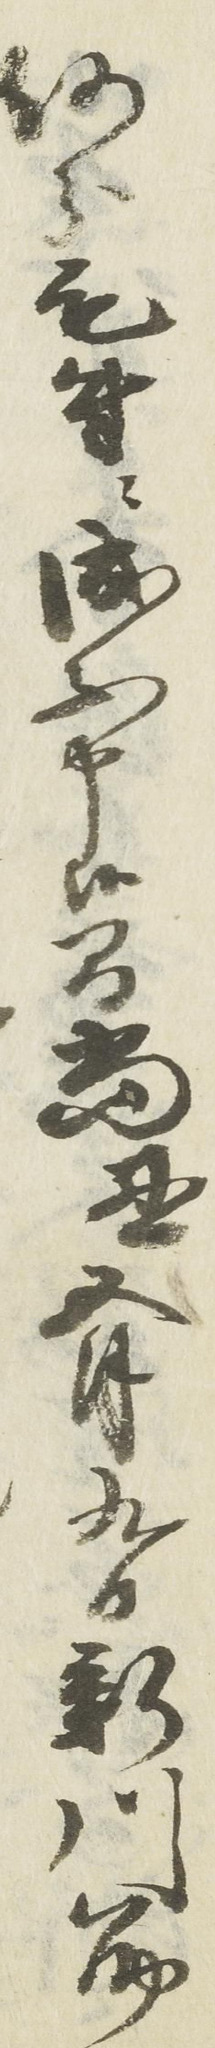何分毛付ニ成不申候間当丑五月九日新川筋
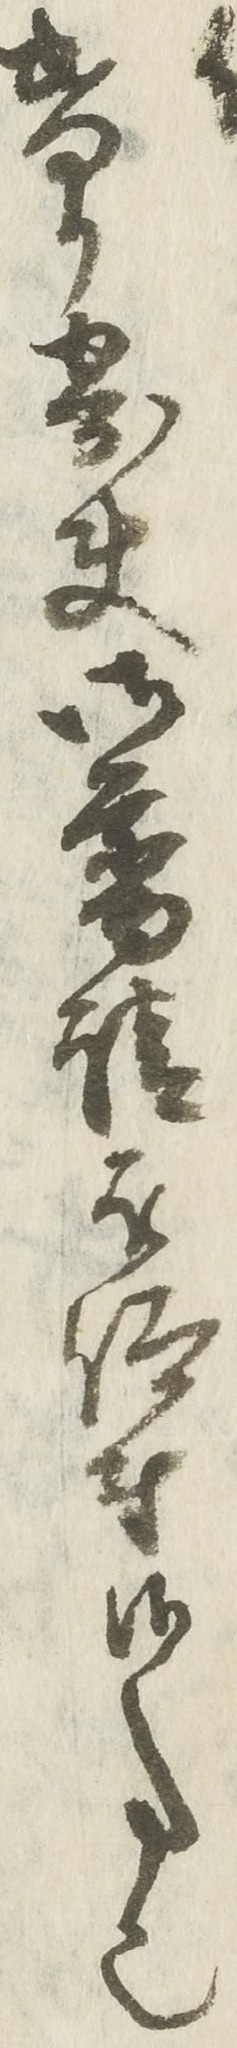替り寄夫御普請被仰付候事也
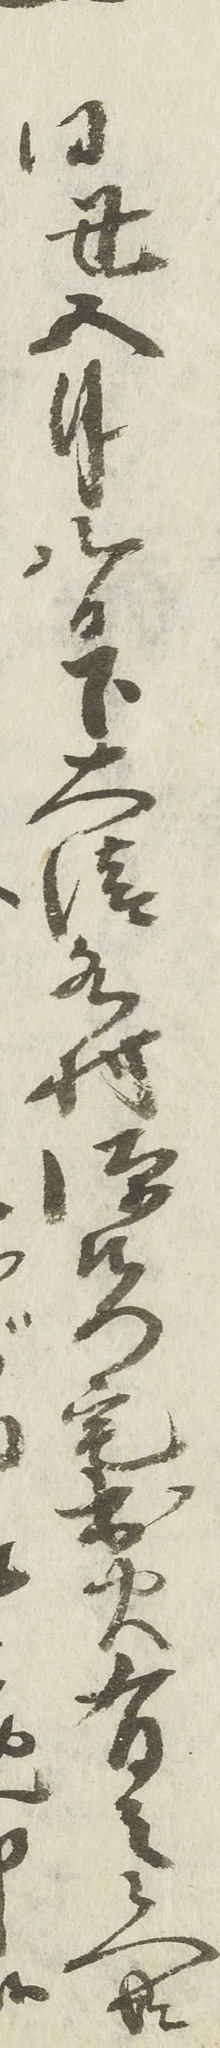一同丑五月八日下大清水村源左衛門宅出火有之候へ共
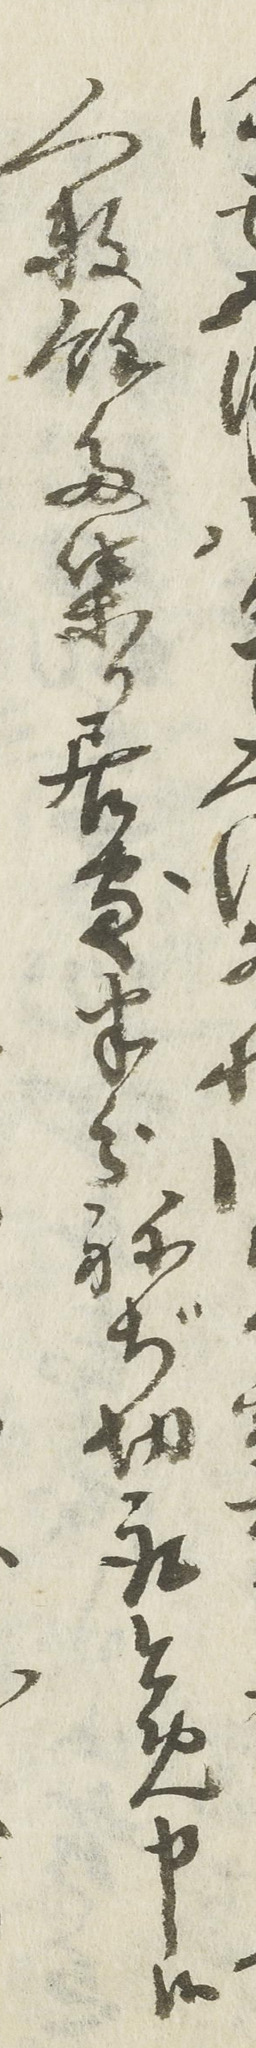人数餘多集り居家半分程ねじ切取とめ申候
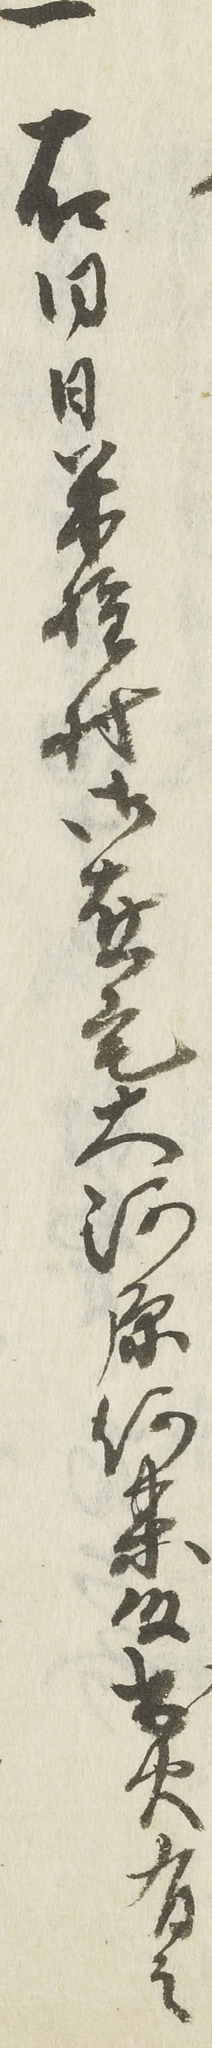一右同日米野村御在宅大河原何某殿出火有之
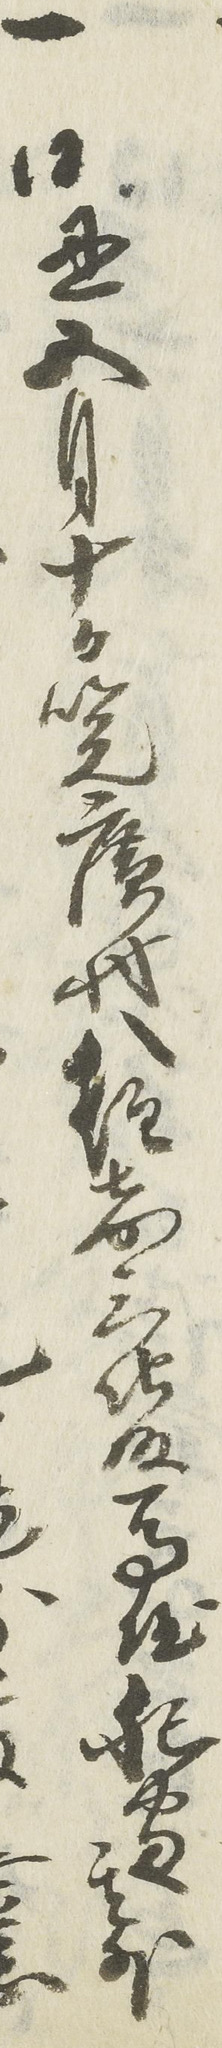一同丑五月十日晩広村八住喜三次殿馬屋肥家其外
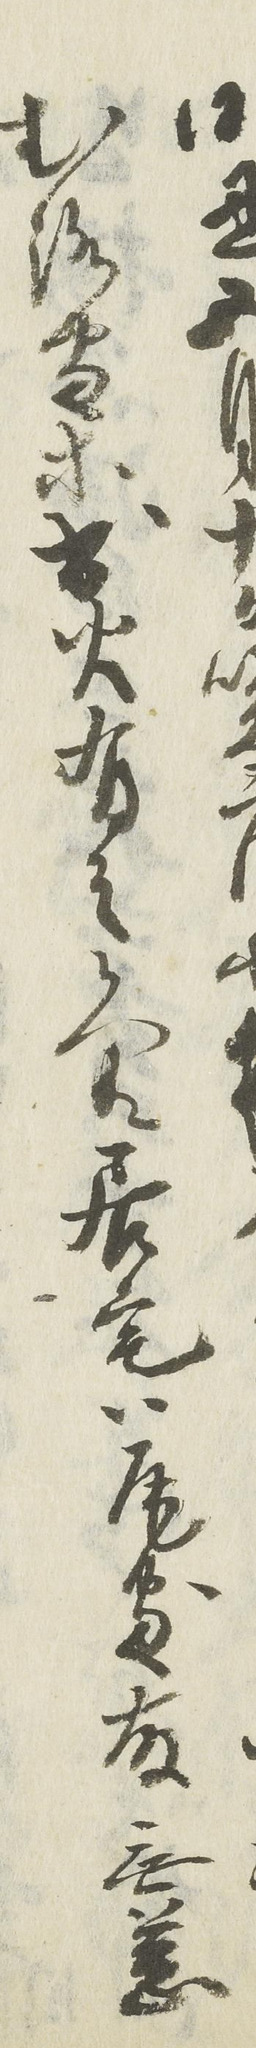むろ家等出火有之候へ共居宅は瓦家故無恙
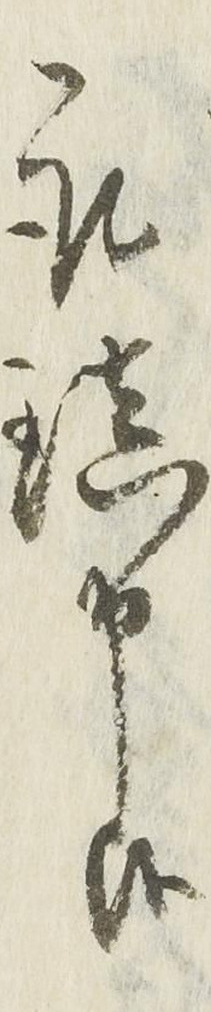取鎮申候
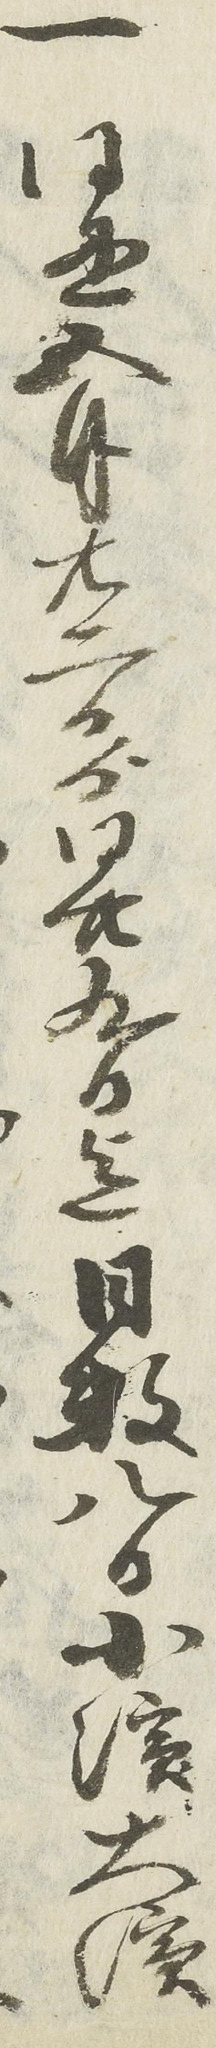一同丑五月廿二日ゟ同廿九日迄日数八日小浜大浜
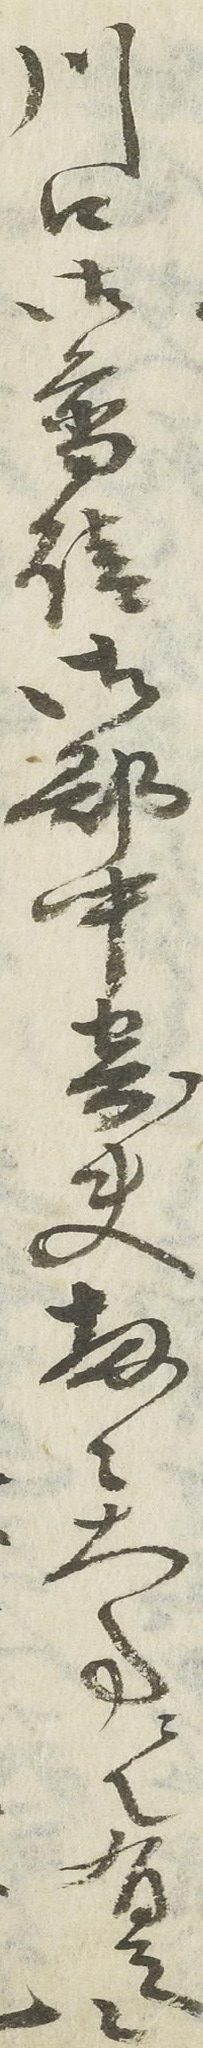川口御普請御郡中寄夫扨々大事ニて有之候
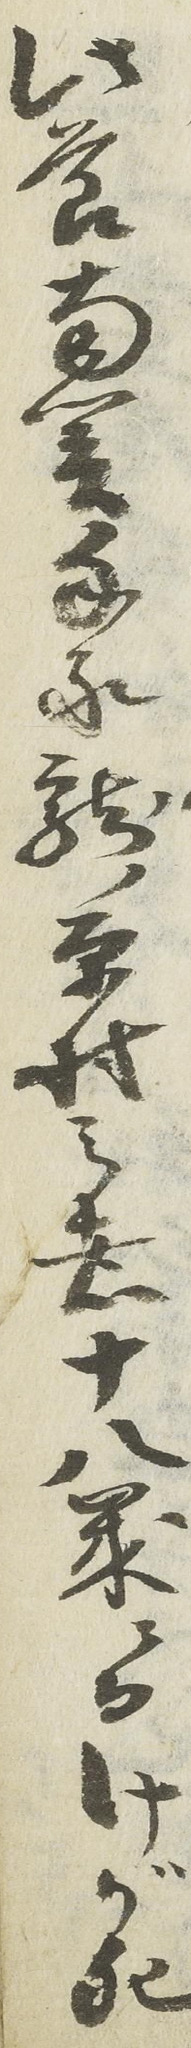此節南関手永龍ノ原村之者十八歳ニ而けが死

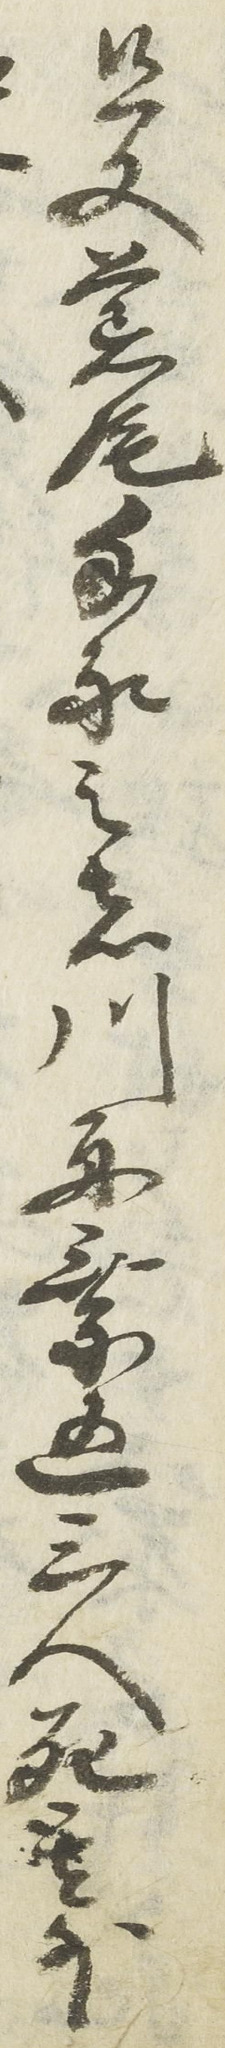且又覚尾手永之者川舟乗込三人死候其外
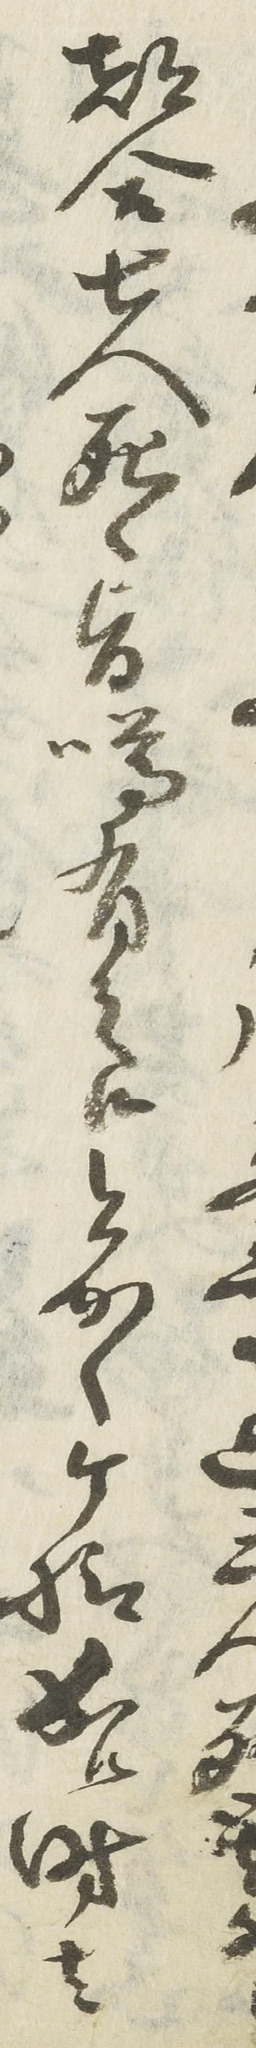都合七人死候旨噂有之候とかくケ様成ル時は
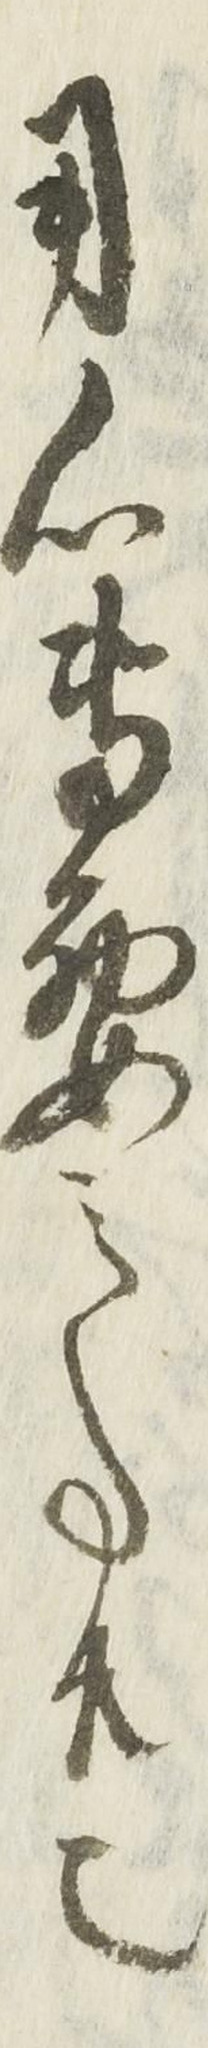用心専要之事共也
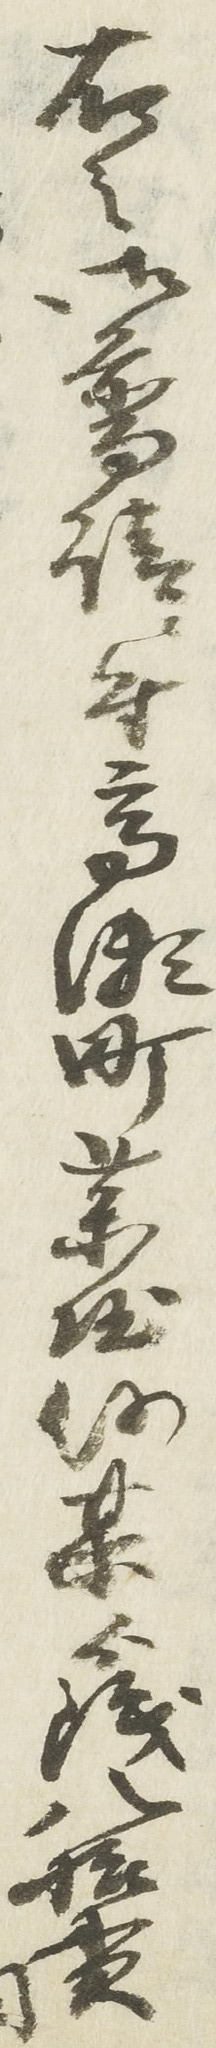右之御普請ニ付高瀬町薬屋何某ゟ銭八拾貫目
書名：後見笑
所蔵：東京大学地震研究所図書室 Earthquake Research Institute Library, The University of Tokyo, JAPAN
